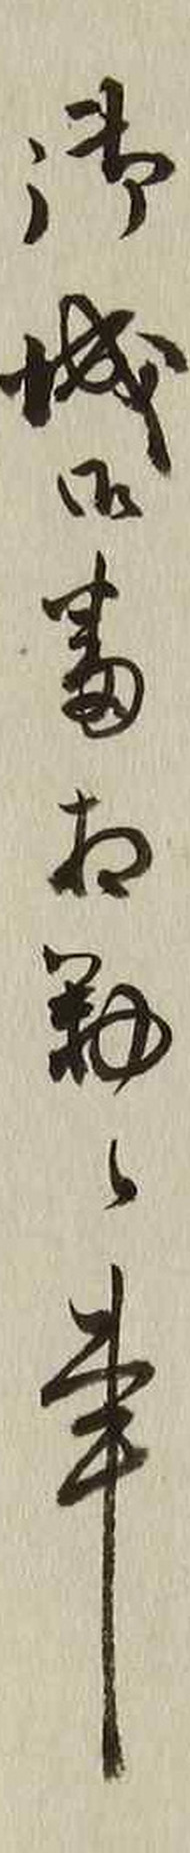御城御番相勤候事
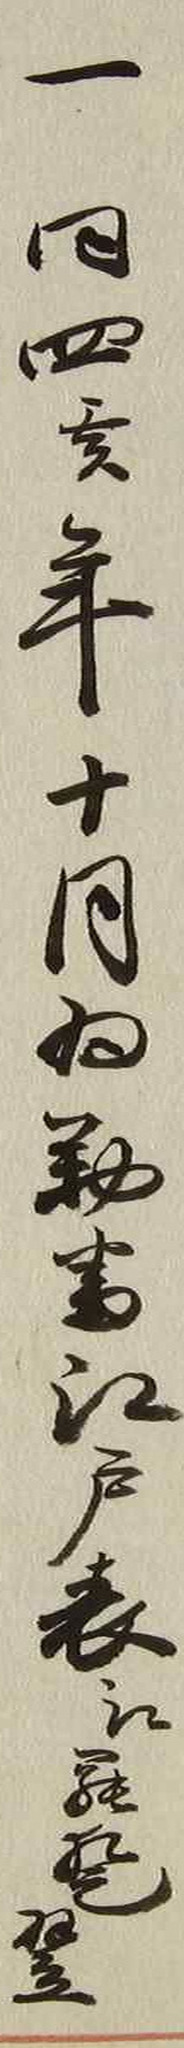一同四亥年十月為勤番江戸表江罷登翌
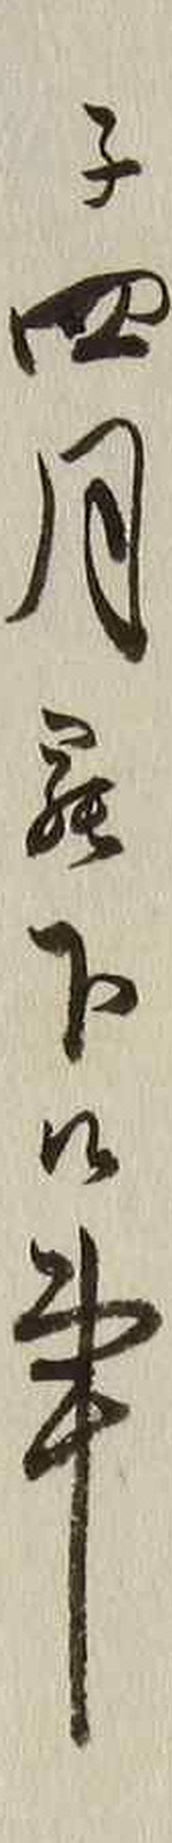子四月罷下候事
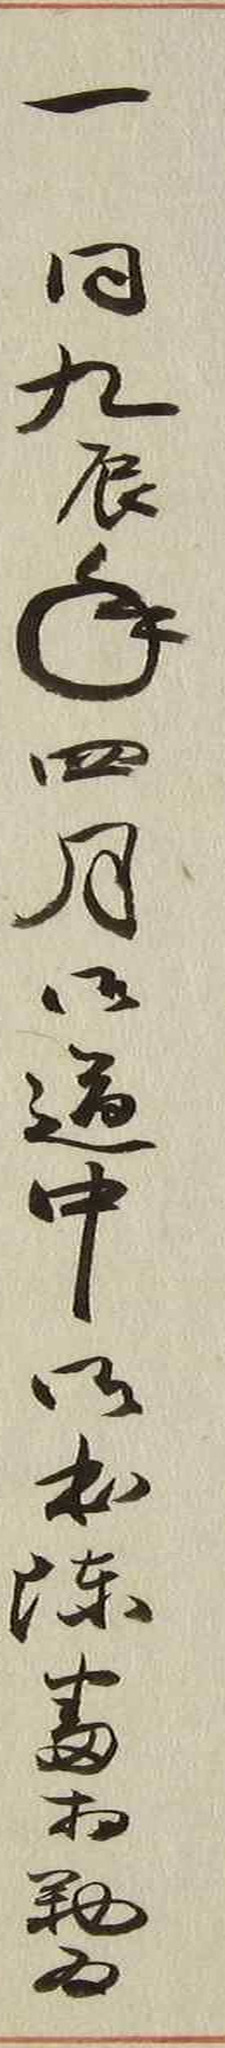一同九辰年四月御道中御出陣番相勤為
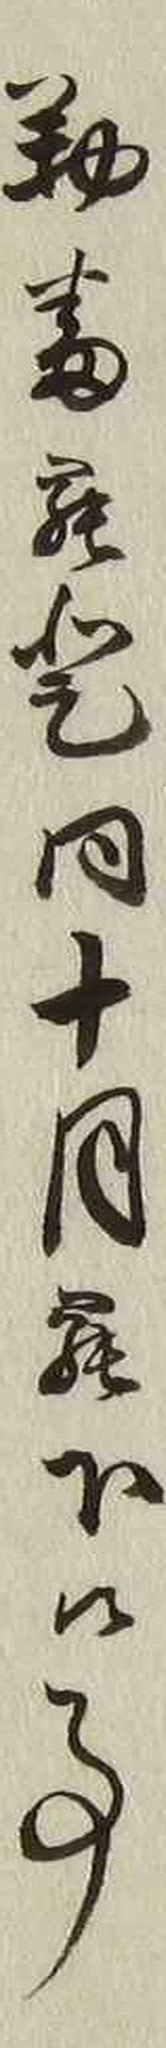勤番罷登同十月罷下候事
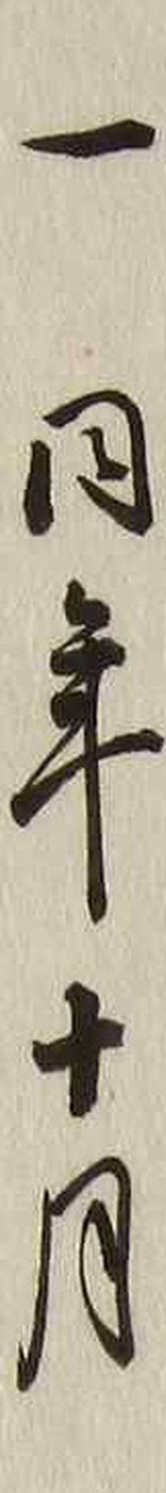一同年十月
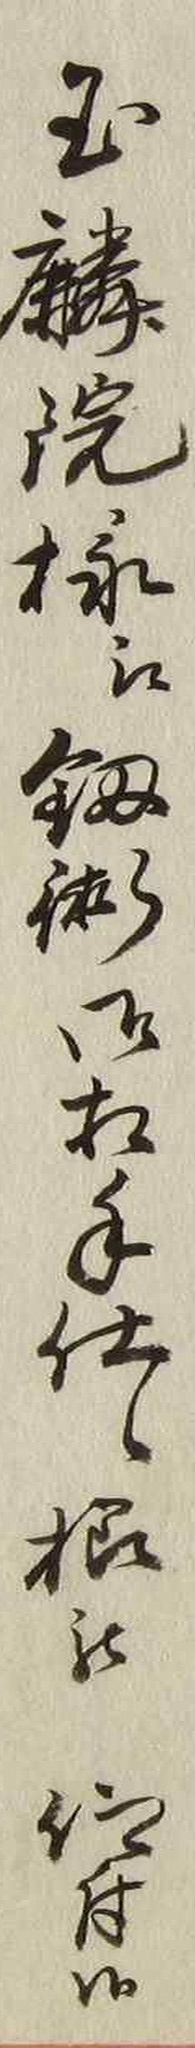玉麟院様江剣術御相手仕候様被仰付候
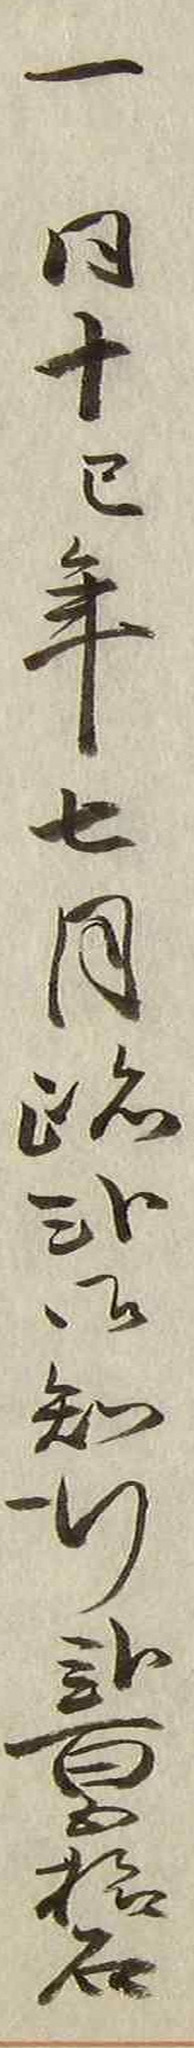一同十巳年七月跡式御知行弐百五拾石
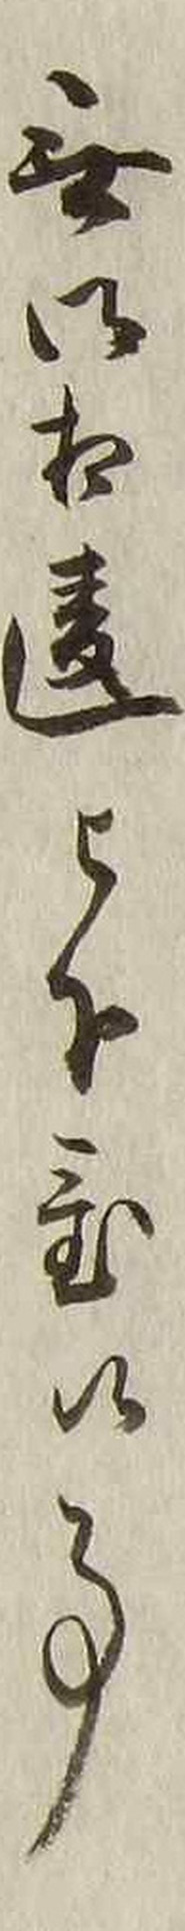無御相違被下置候事
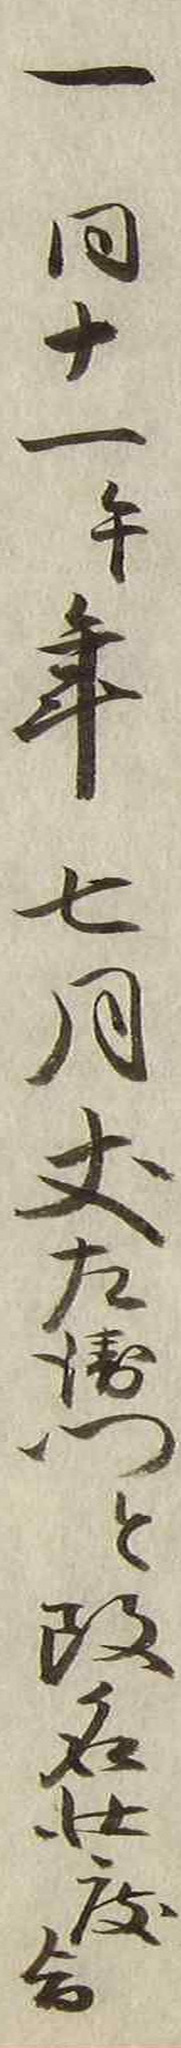一同十一午年七月丈左衛門と改名仕度旨

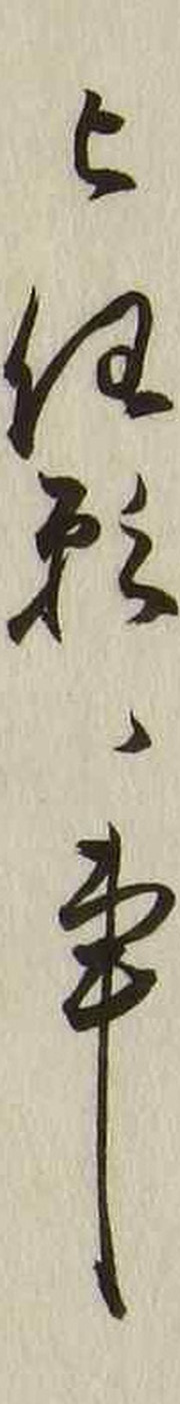被任願候事
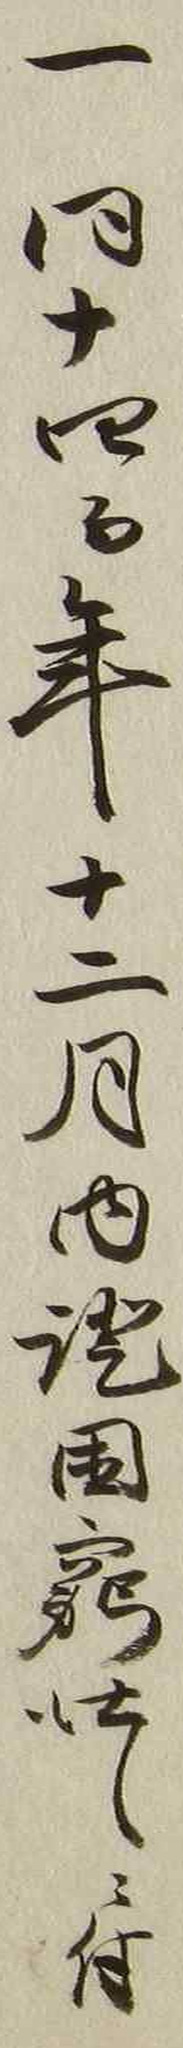一同十四酉年十二月内証困窮仕候ニ付
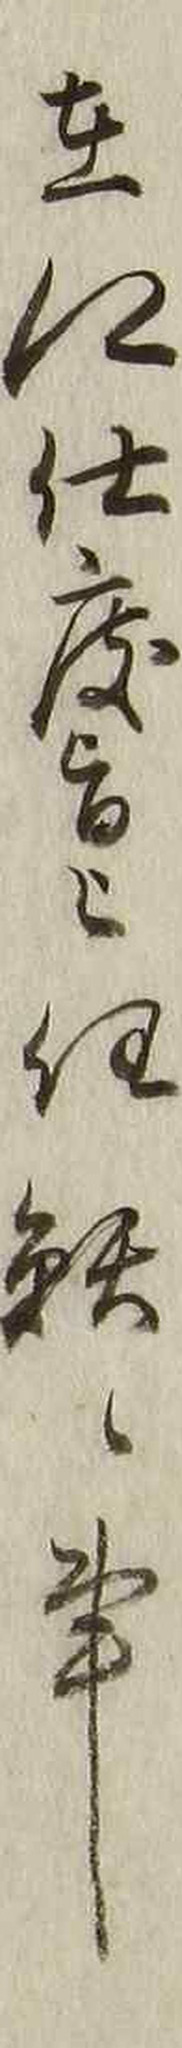在郷仕度旨被任願候事
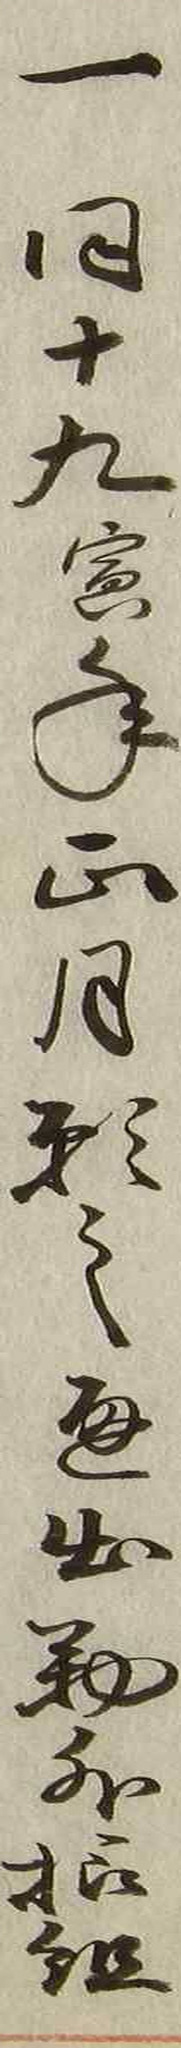一同十九寅年正月願之通出勤外様組
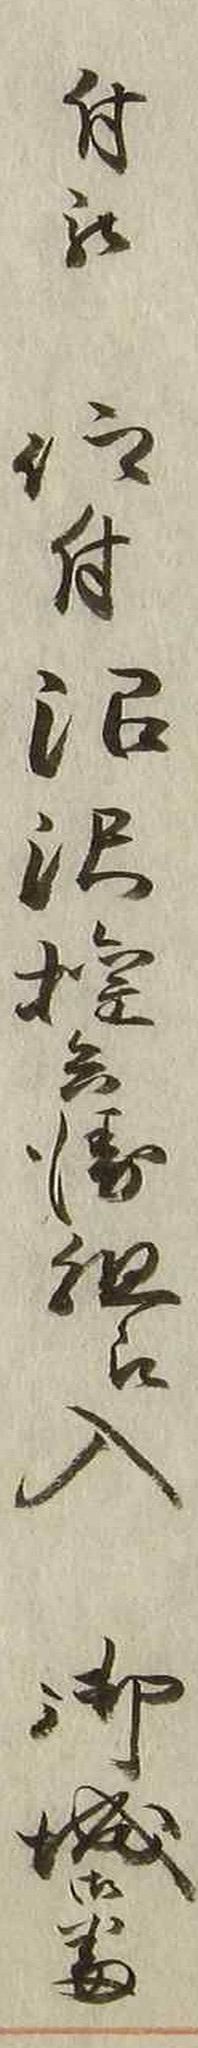付被仰付沼沢権兵衛組江入御城御番
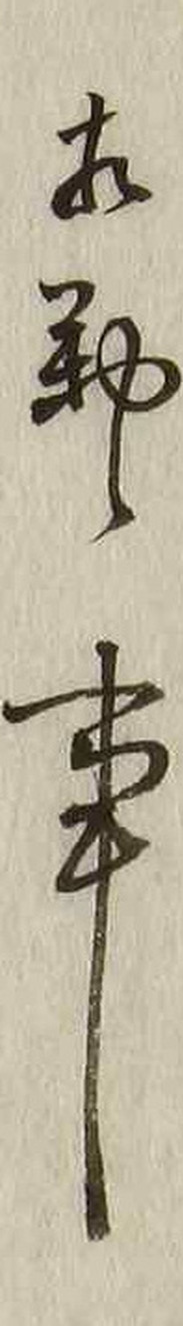相勤候事
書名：諸士系譜　巻之15　い之部15
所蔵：会津若松市立会津図書館
